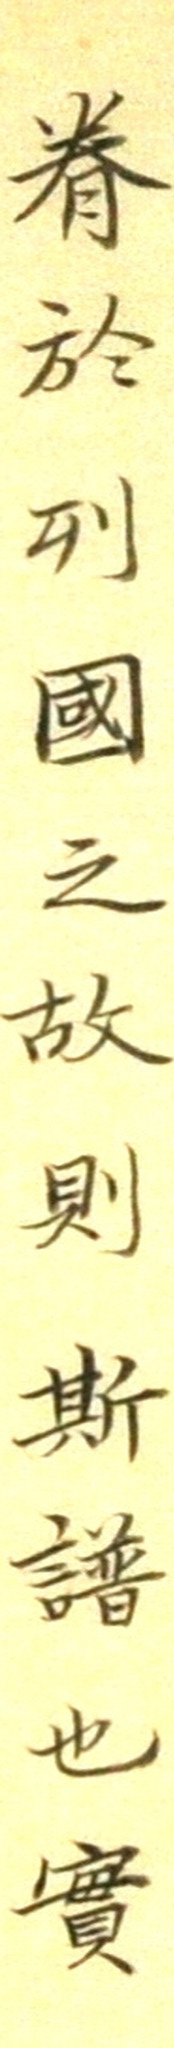眷於列国之故則斯譜也実
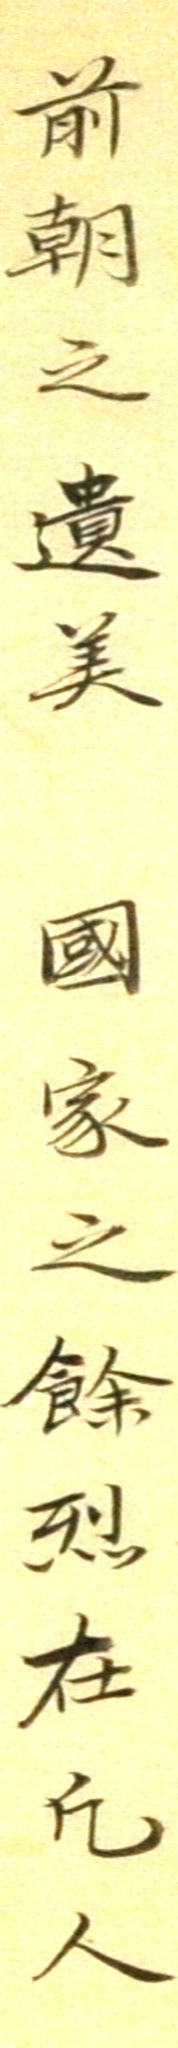前朝之遺美国家之余烈在凡人
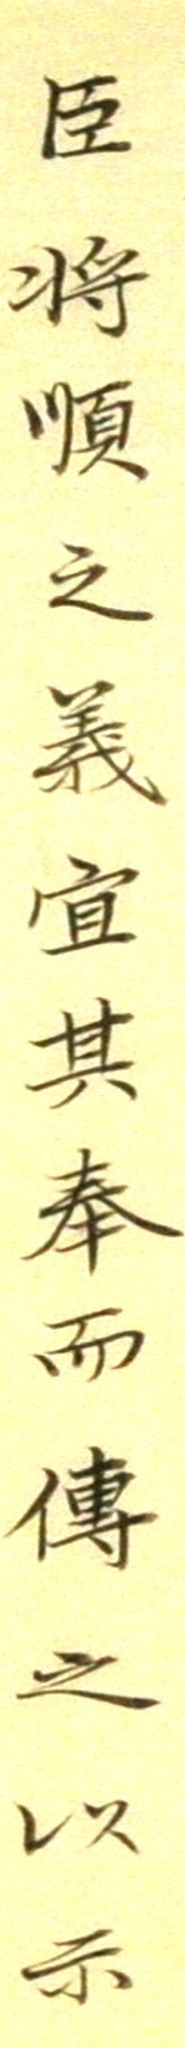臣将順之義宜其奉而伝之以示
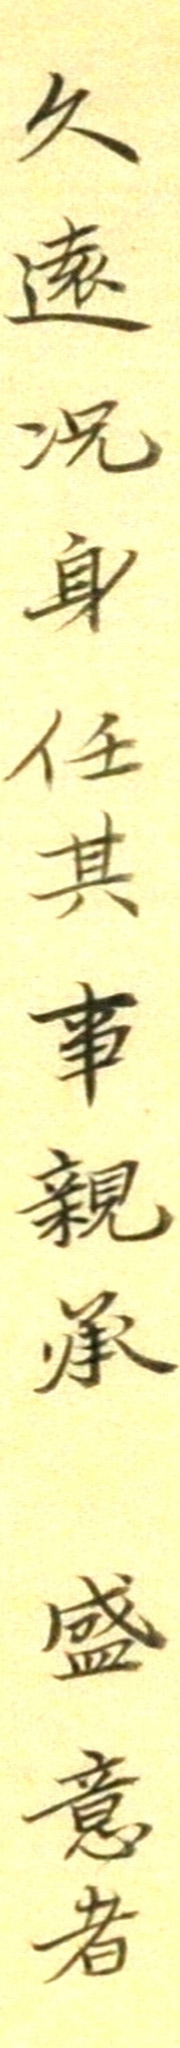久遠况身任其事親承盛意者
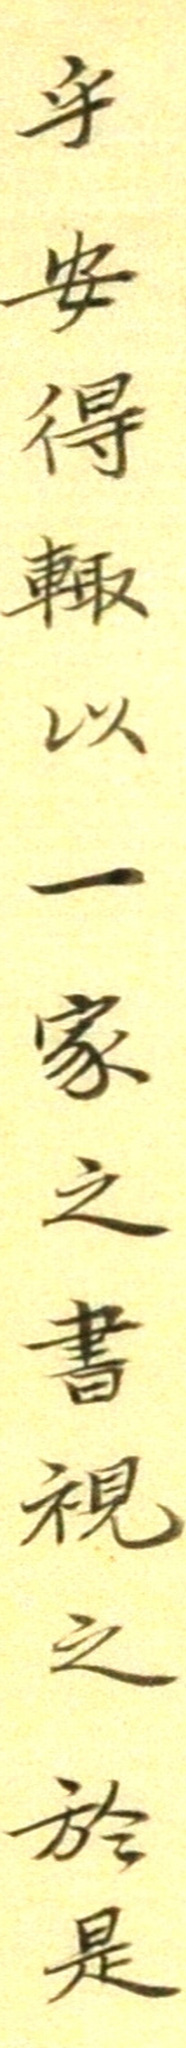乎安得輙以一家之書視之於是
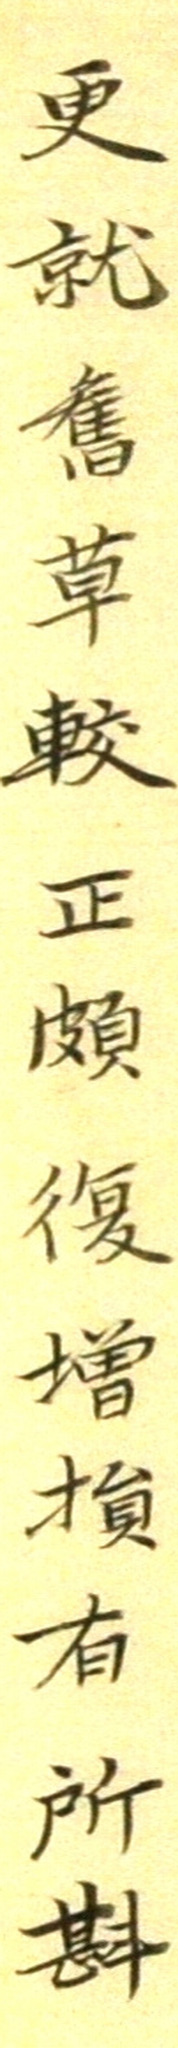更就旧草更正頗復増損有所斟
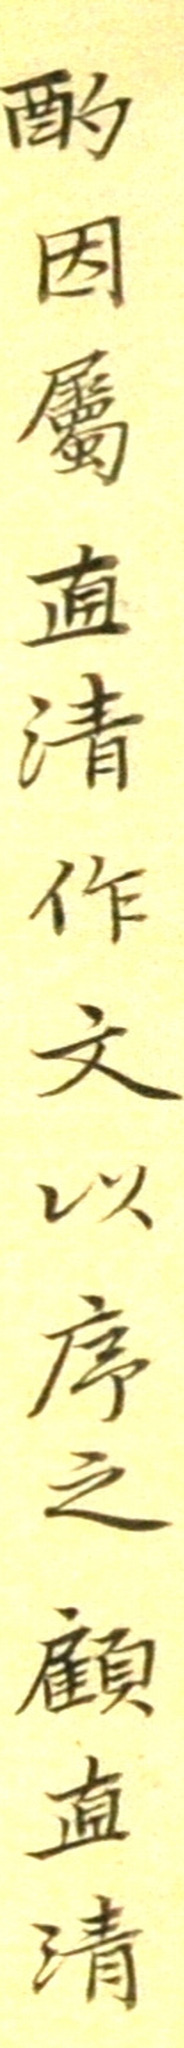酌因属直清作文以序之顧直清

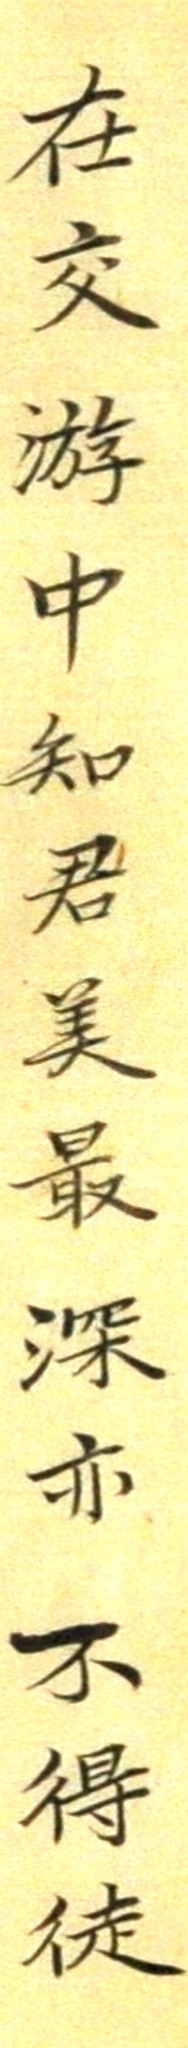在交游中知君美最深亦不得徒
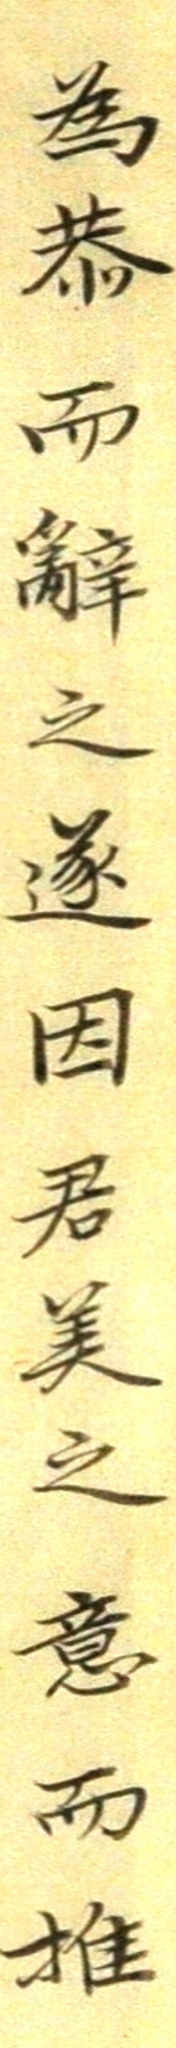為恭而辞之遂因君美之意而推
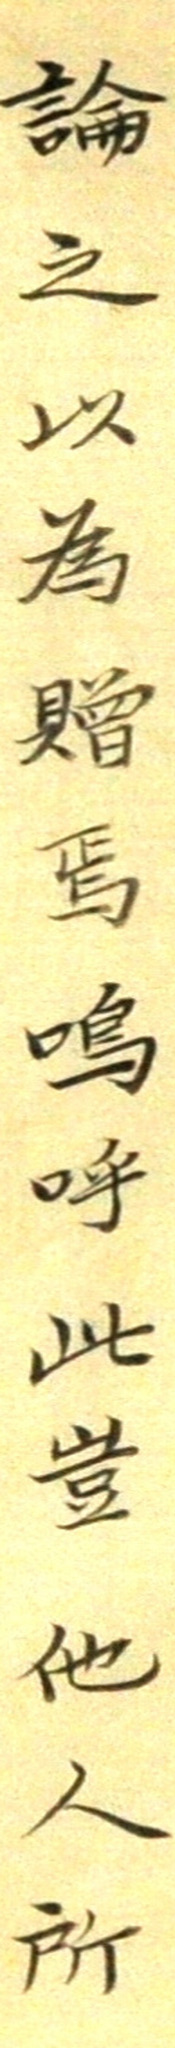論之以為贈焉嗚呼此豈他人所
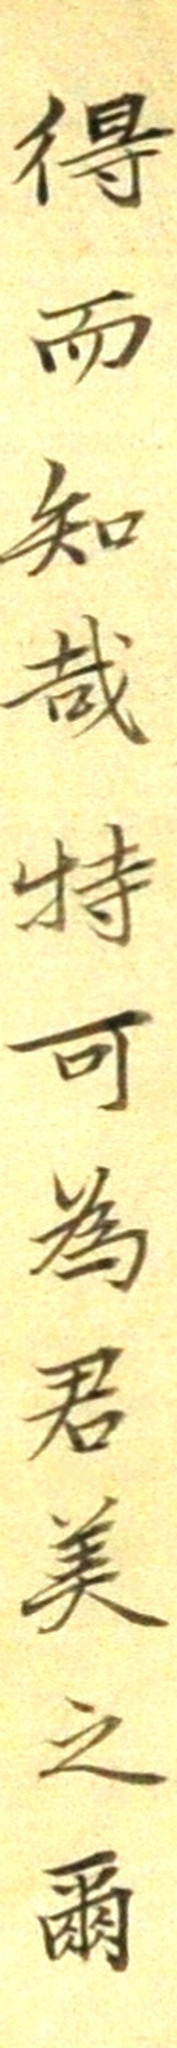得而知哉特可為君美之爾
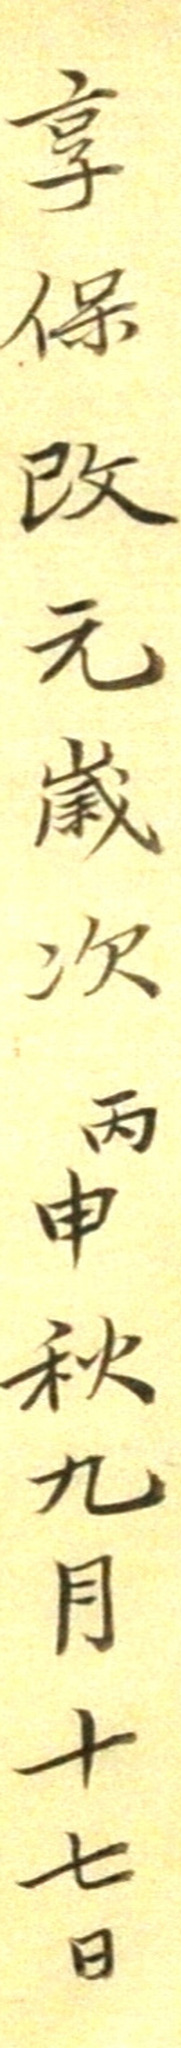享保改元歳次丙申秋九月十七日
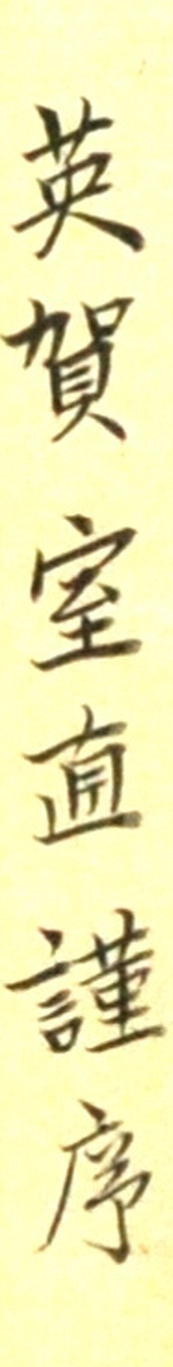英賀室直謹序
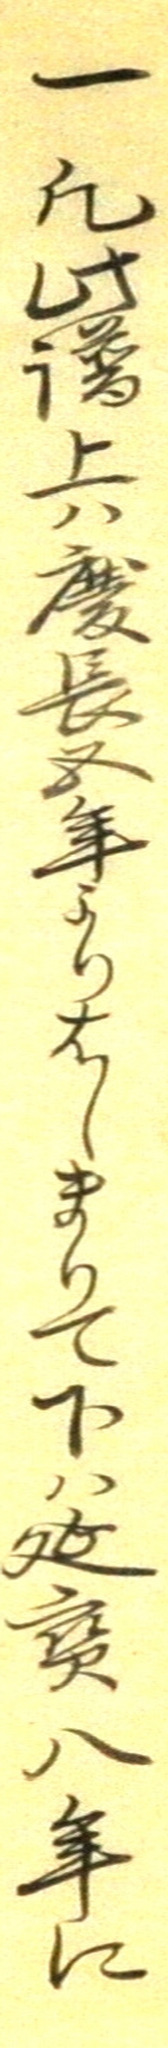一凡此譜上は慶長五年よりはしまりて下は延宝八年に
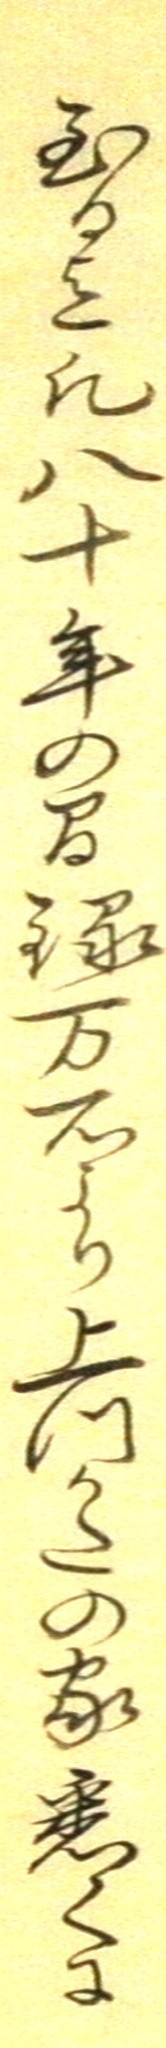至る迄凡八十年の間録万石より上つかたの家悉くに
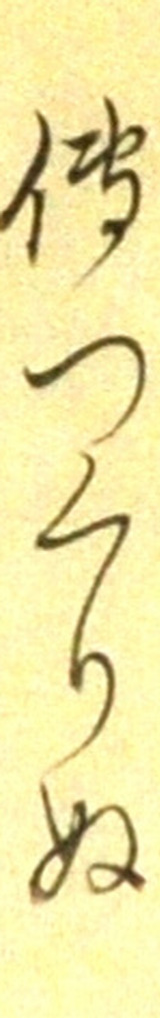伝つくりぬ
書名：藩翰譜（一）
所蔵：伊那市立高遠町図書館・合同会社AMANE
